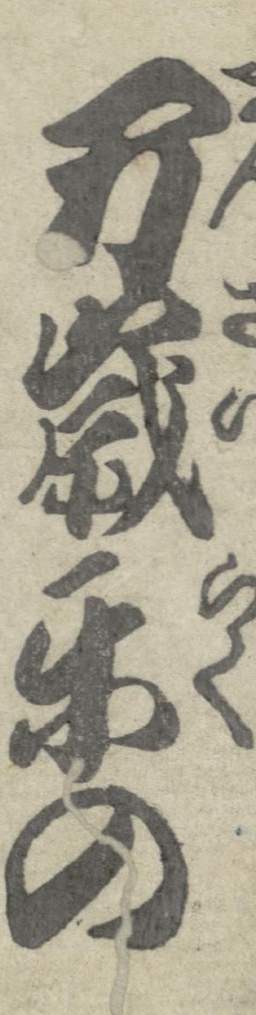万歳楽の
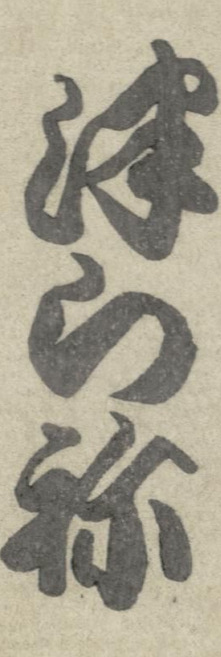つらね
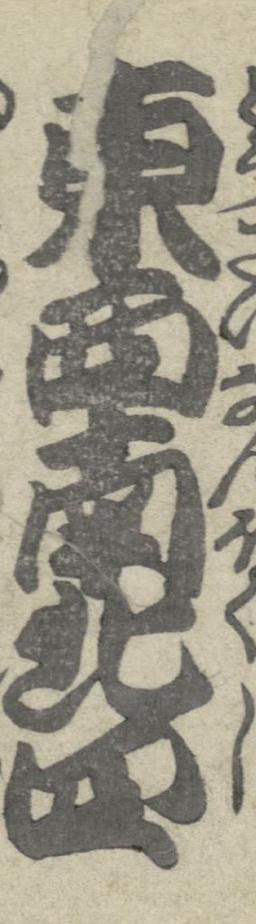東西南北四
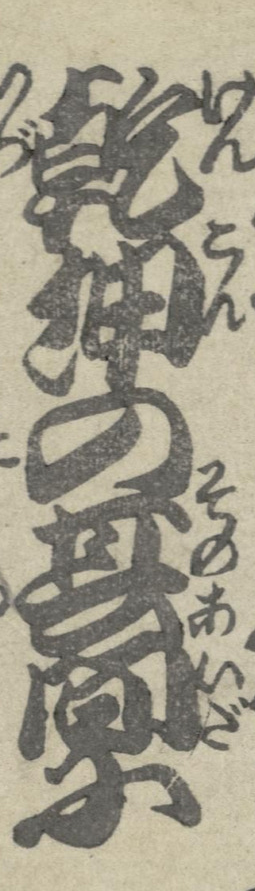乾坤の其間に
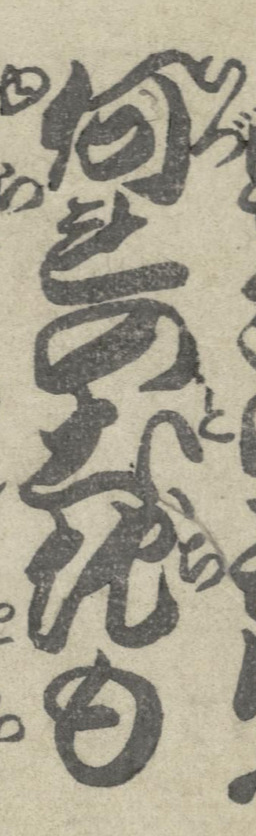何れの土地も
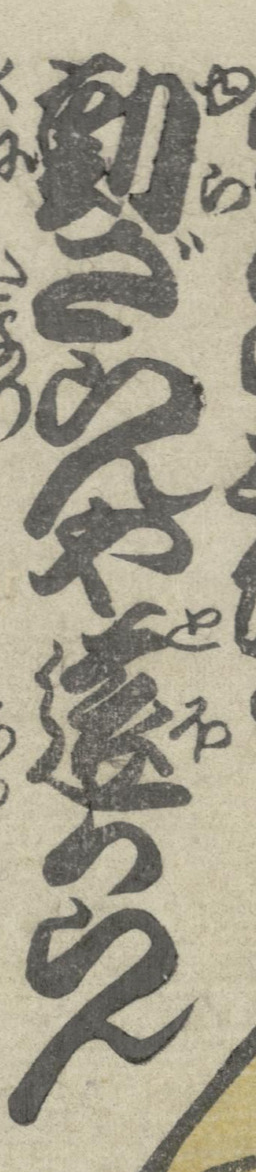動ざらんや遠からん
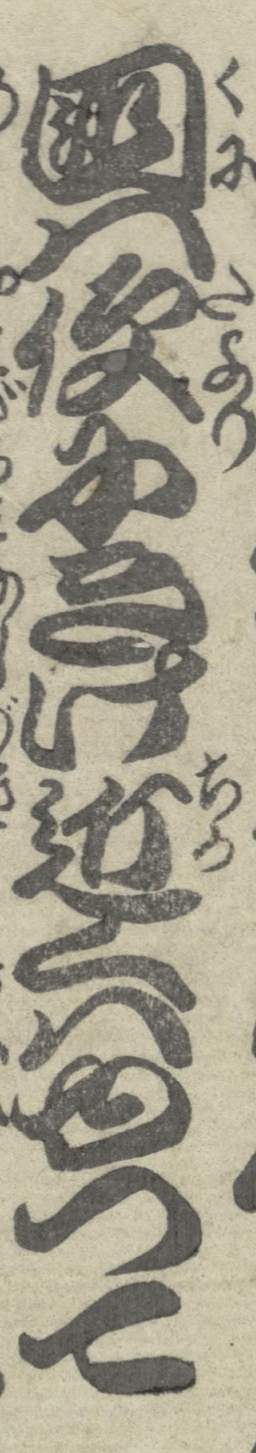国ハ便にきけ近くハゆつて
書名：聖代要石治　万歳楽のつらね
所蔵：東京大学地震研究所図書室 Earthquake Research Institute Library, The University of Tokyo, JAPAN
